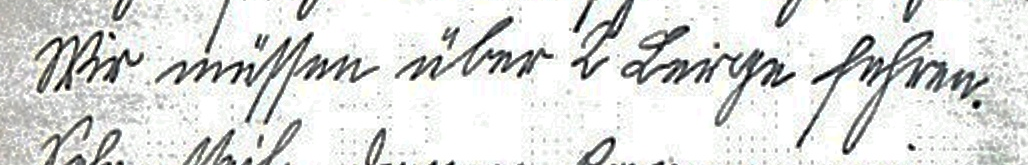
Wir müssten über zwei Berge fahren.
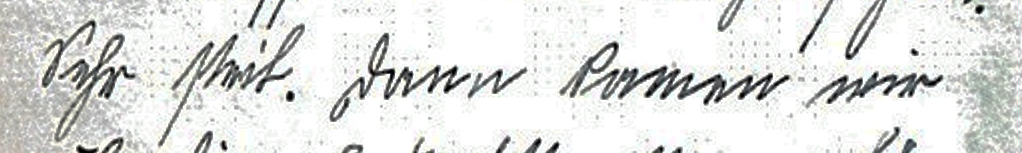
Sehr steil. Dann kamen wir
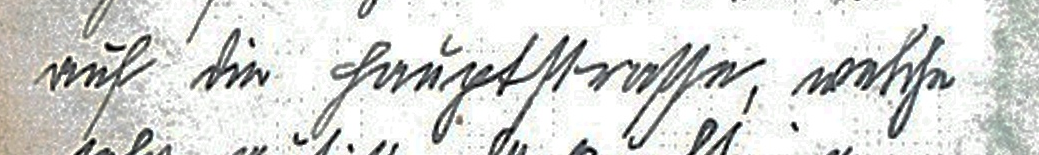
auf die Hauptstrasse, welche
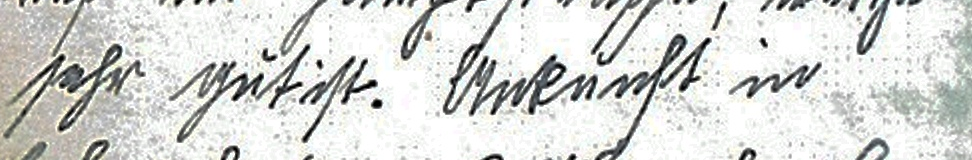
sehr gut ist. Ankunft in
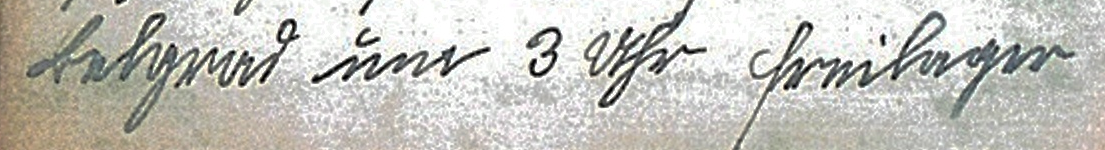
Belgrad um 3 Uhr Freilager
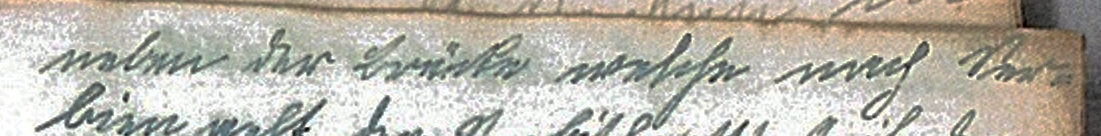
neben der Brücke welche nach Ser-
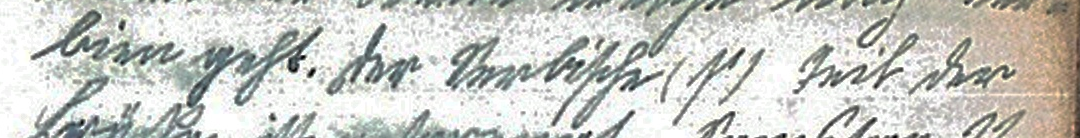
bien geht. Der serbische (S) teil der
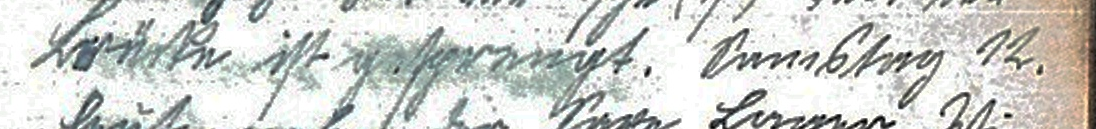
Brücke ist gesprengt. Samstag 12.
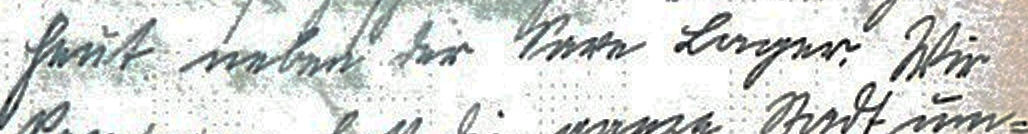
heut neben der Save Lager. Wir
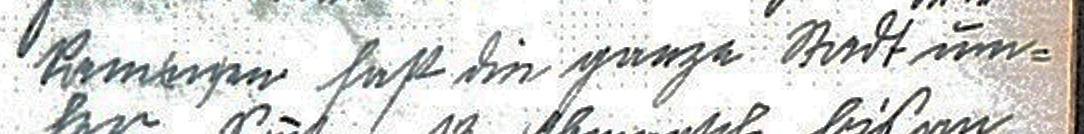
kommen fast die ganze Nacht um-
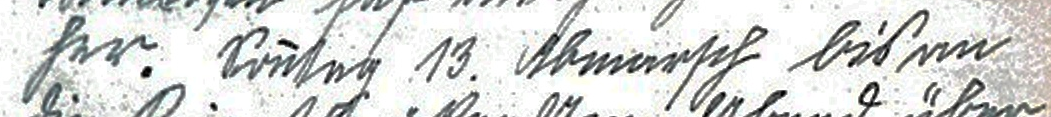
her. Sonntag 13. Abmarsch bis an
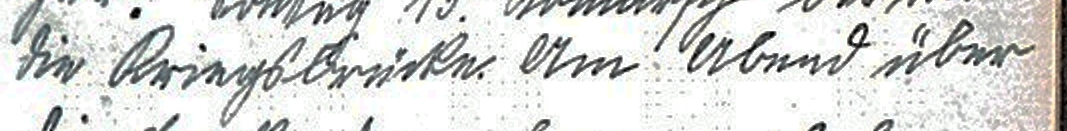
die Kriegsbrücke. Am Abend über
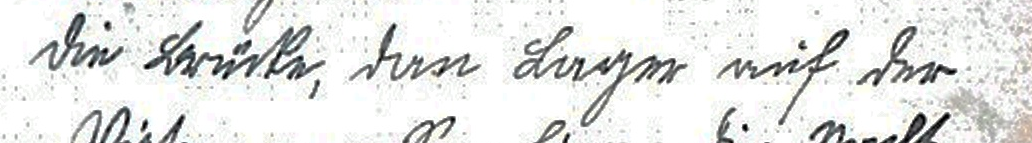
die Brücke, dan Lagern auf der
